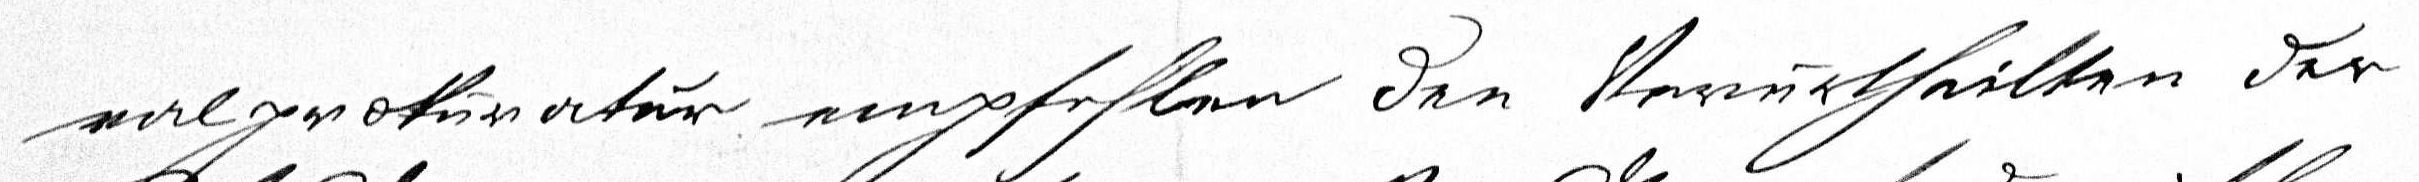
ralprokuratur empfehlen den Verurtheilten der
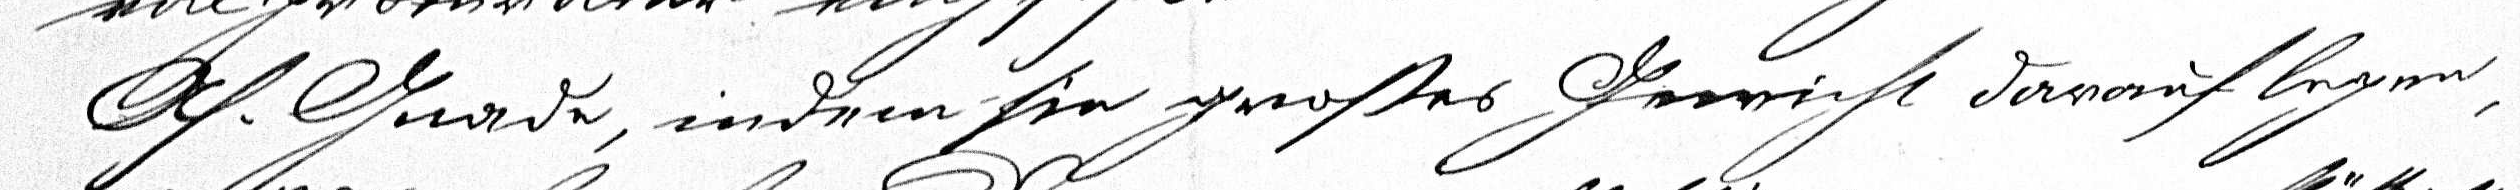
Ah. Gnade, indem sie großes Gewicht darauf legen,
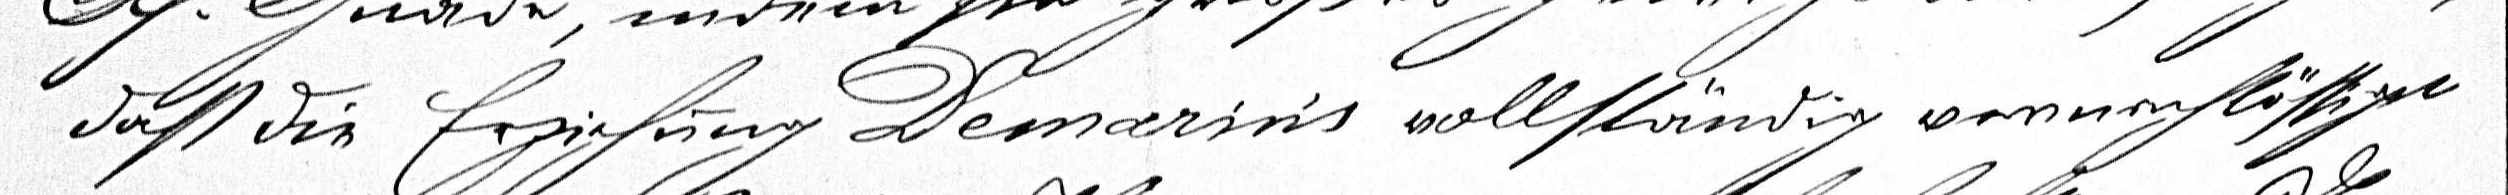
daß die Erziehung Demarins vollständig vernachlässigt
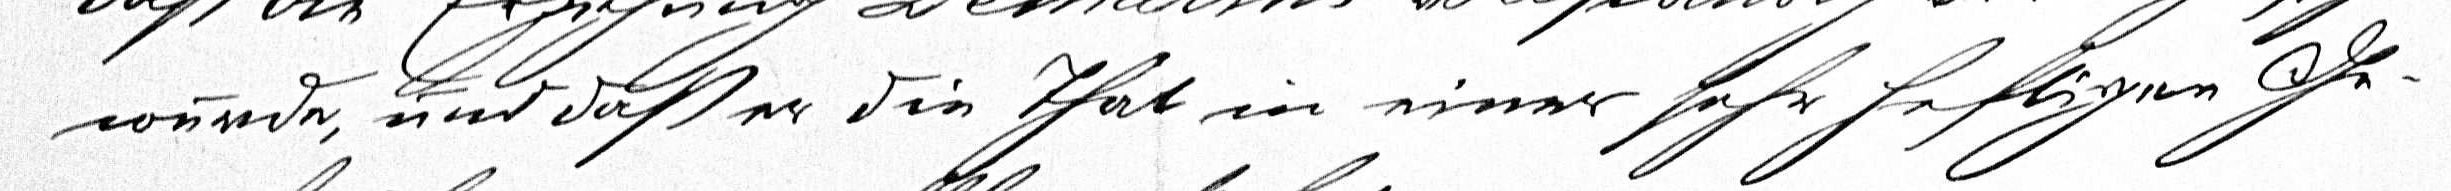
wurde, und daß er die That in einer sehr heftigen Ge¬
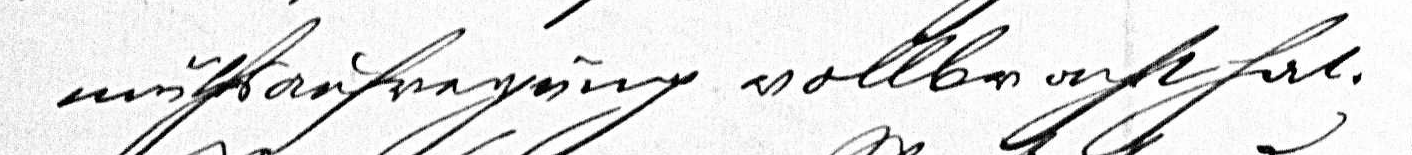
müthsaufregung vollbracht hat.
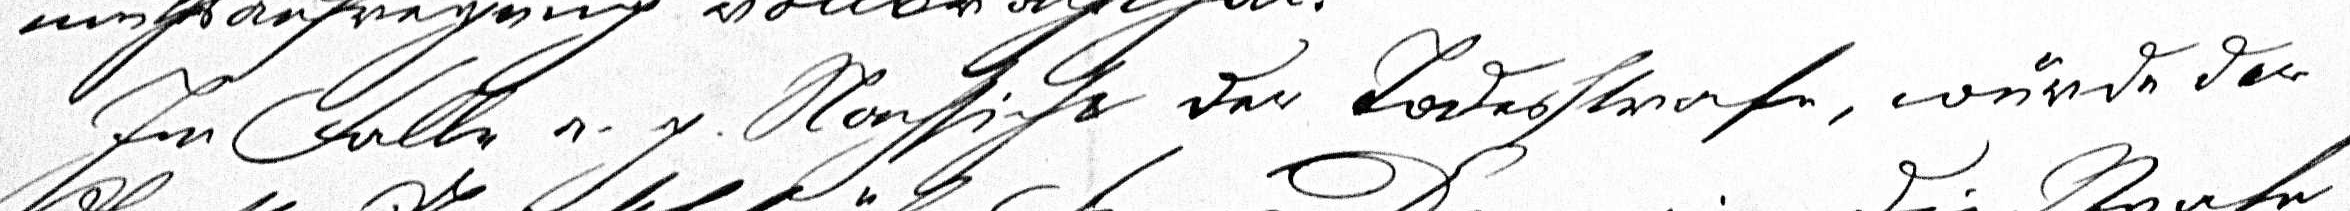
Im Falle a.g. Nachsicht der Todesstrafe, würde der
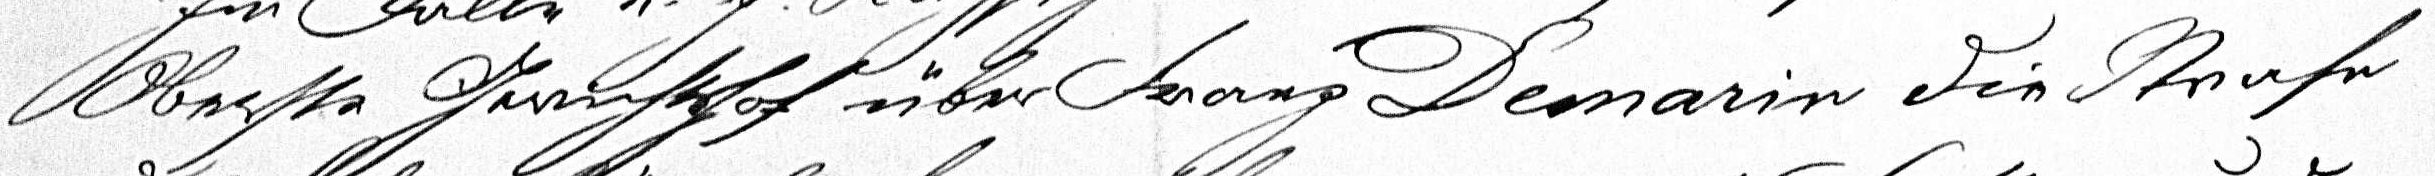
Oberste Gerichtshof über Franz Demarin die Strafe
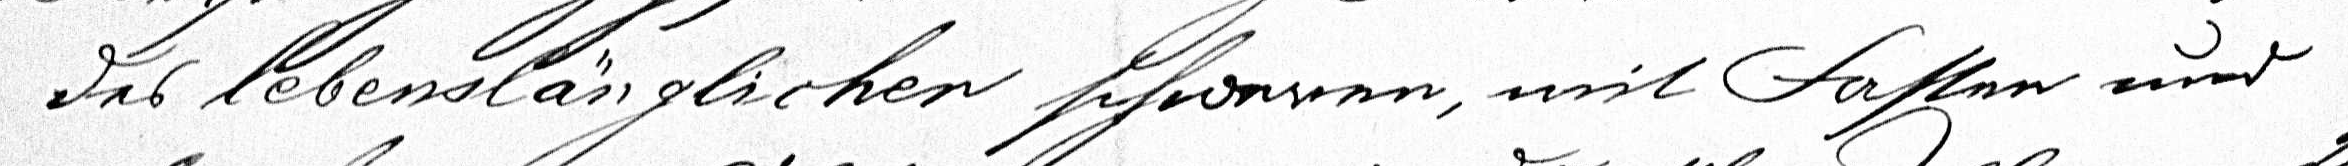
des lebenslänglicher schweren, mit Fasten und
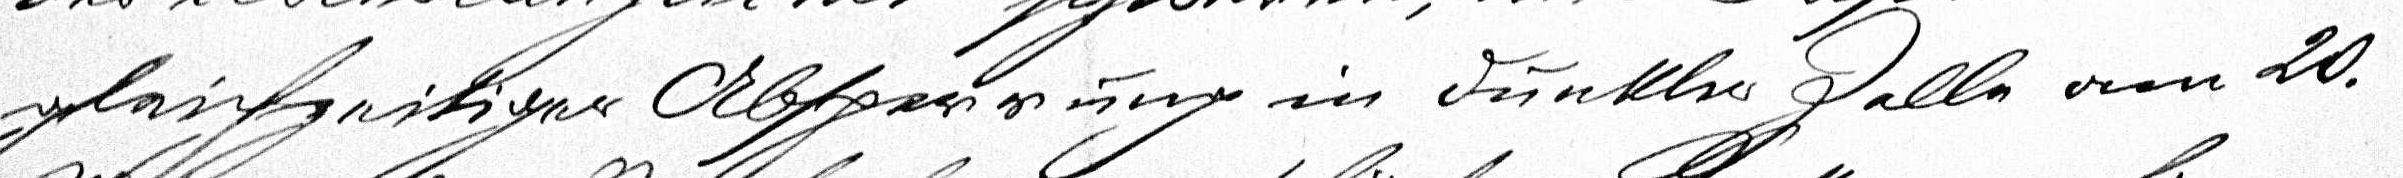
gleichzeitiger Absperrung in dunkler Zelle am 20.
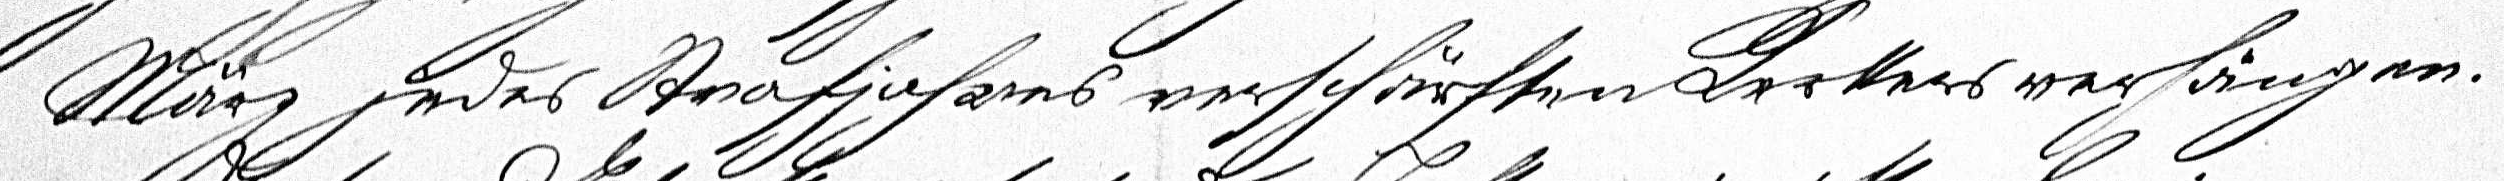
März jedes Strafjahres verschärften Kerkers verhängen.
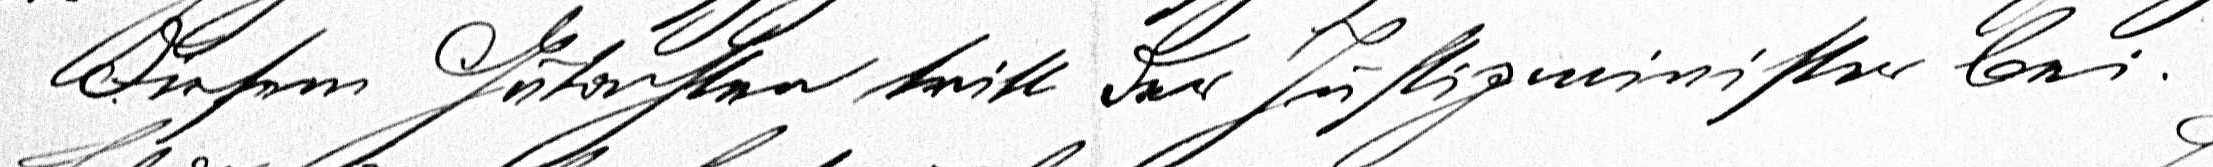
Diesem Gutachten tritt der Justizminister bei.
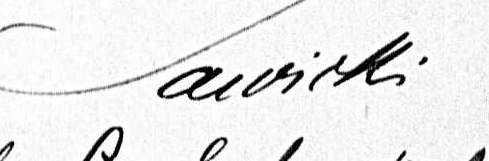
Sawicki
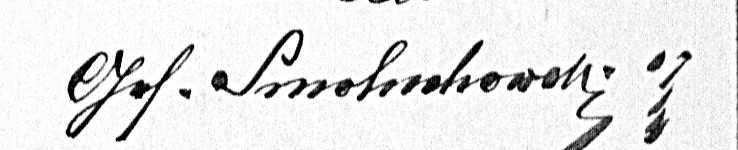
Ges. Smoluchowski 17/11
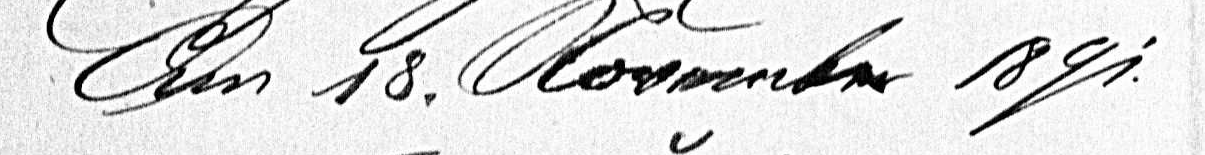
Am 18. November 1891
